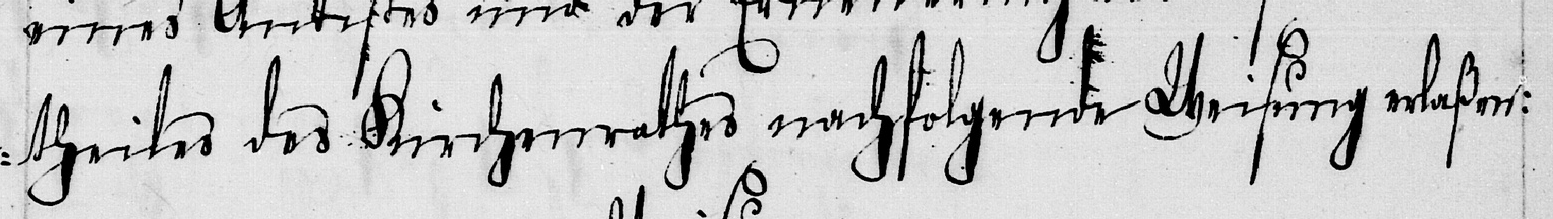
theiles des Kirchenrathes nachfolgende Weisung erlaßen:
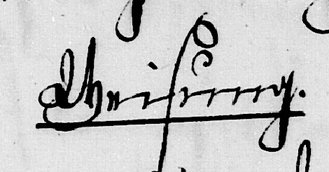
Weisung.
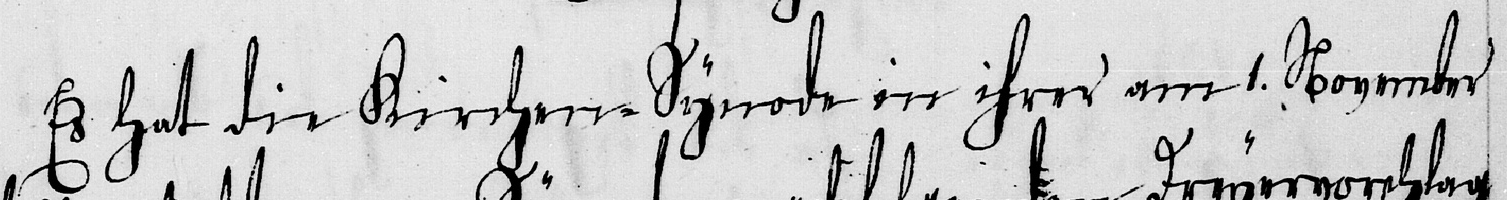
Es hat die Kirchen-Synode in ihrer am 1. November
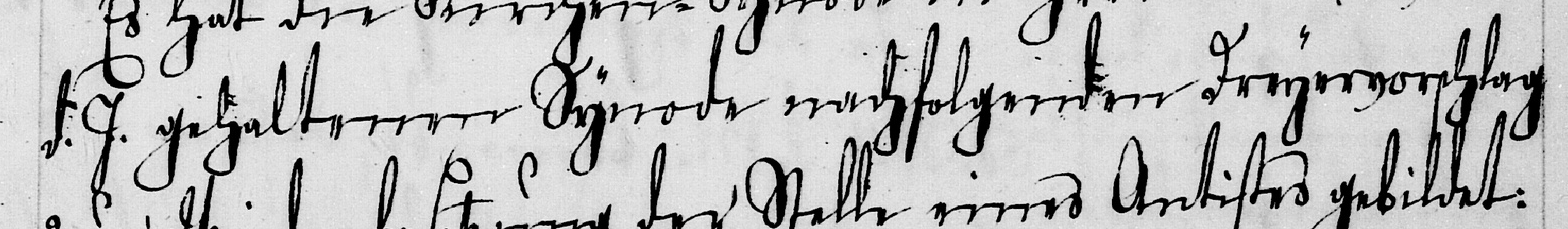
d. J. gehaltenen Synode nachfolgenden Dreyervorschlag
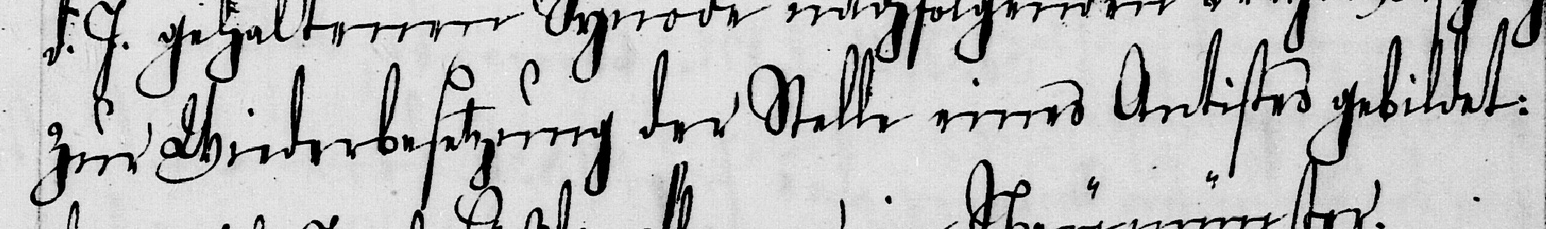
zur Wiederbesetzung der Stelle eines Antistes gebildet:
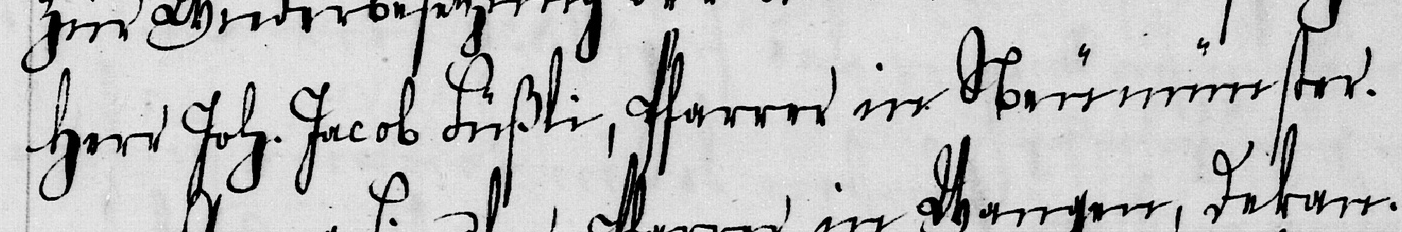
Herr Joh. Jacob Füßli, Pfarrer in Neumünster.
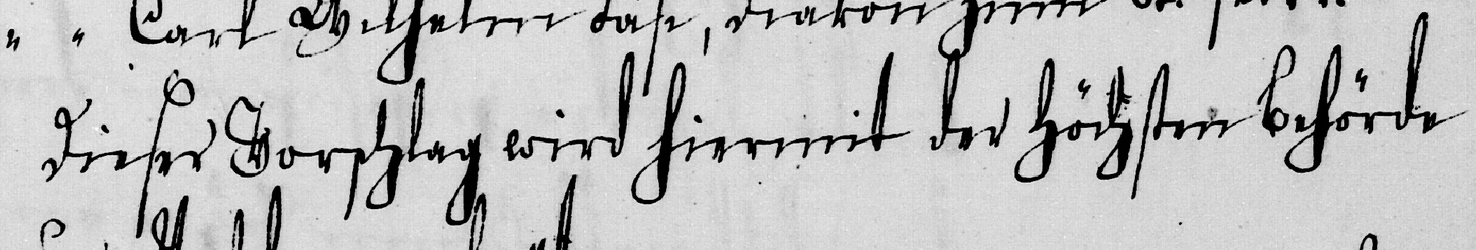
Dieser Vorschlag wird hiermit der Höchsten Behörde
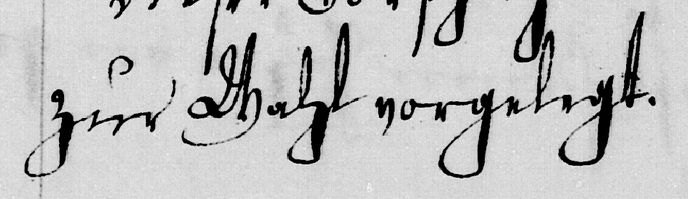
zur Wahl vorgelegt.
